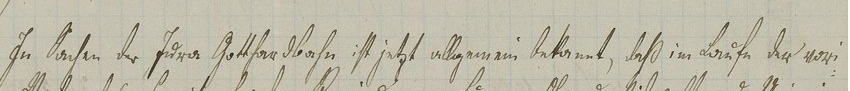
In Sachen der JuraGotthardbahn ist jetzt allgemein bekannt, daß im Laufe der vori-
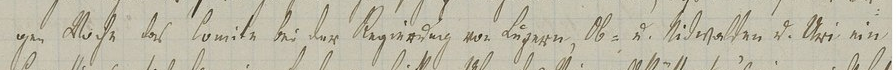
gen Woche das Comite bei der Regierung von Luzern, Ob- u. Nidwalden u. Uri ein
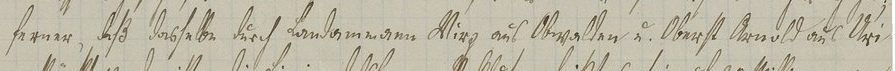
ferner, daß dasselbe durch Landammann Wirz aus Obwalden u. Oberst Arnold aus Uri
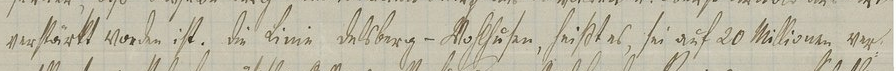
verstärkt worden ist. Die Linie Delsberg–Wohlhusen, heißt es, sei auf 20 Millionen ver-
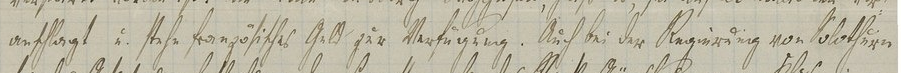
anschlagt u. stehe französisches Geld zur Verfügung. Auch bei der Regierung von Solothurn
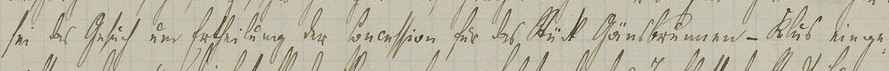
sei das Gesuch um Ertheilung der Concession für das Stück Gänsbrunnen–Klus einge-
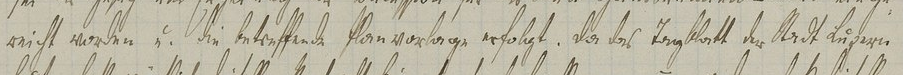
reicht worden u. die betreffende Planvorlage erfolgt. Da das Tagblatt der Stadt Luzern
